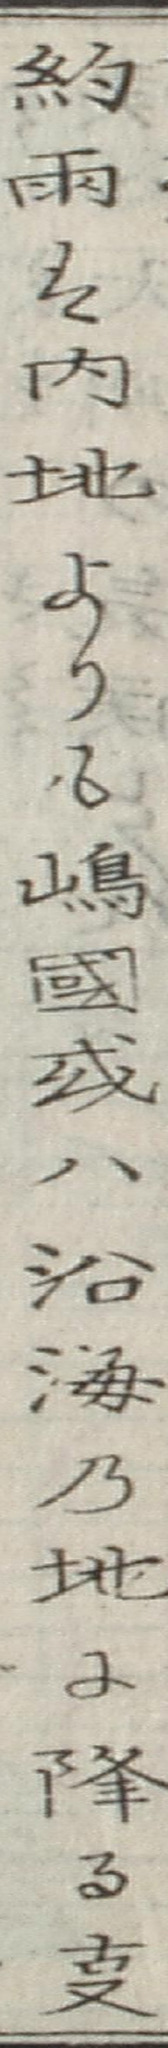約雨は内地よりも島国或は沿海の地に降る事
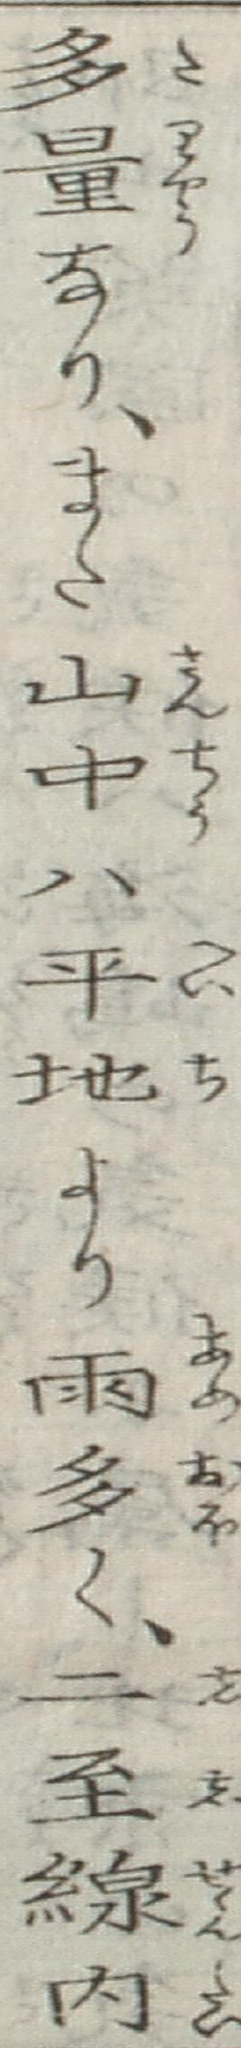多量なり、また山中は平地より雨多く、二至線内
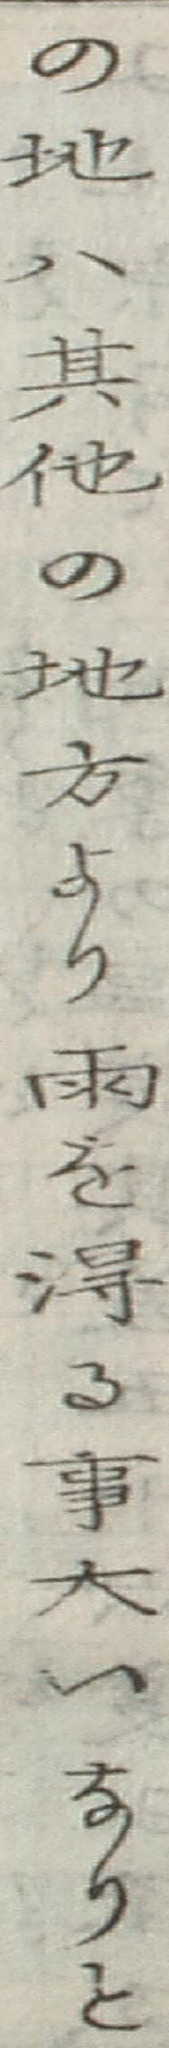の地は其他の地方より雨を得る事大いなりと
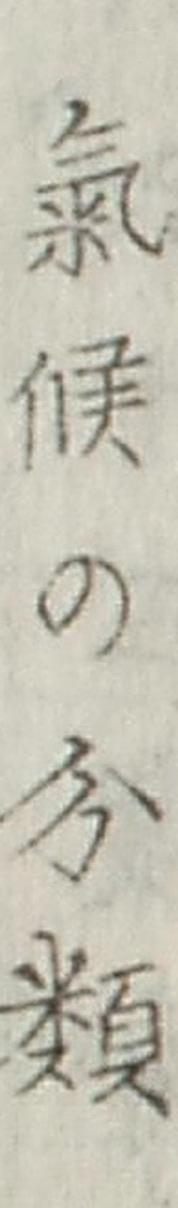気候の分類
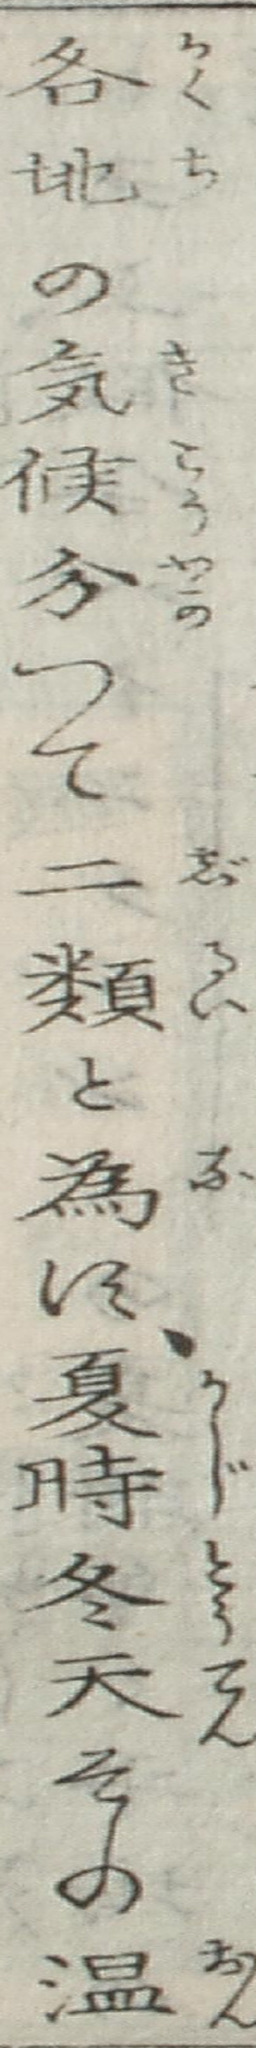各地の気候分つて二類と為す、夏時冬天その温
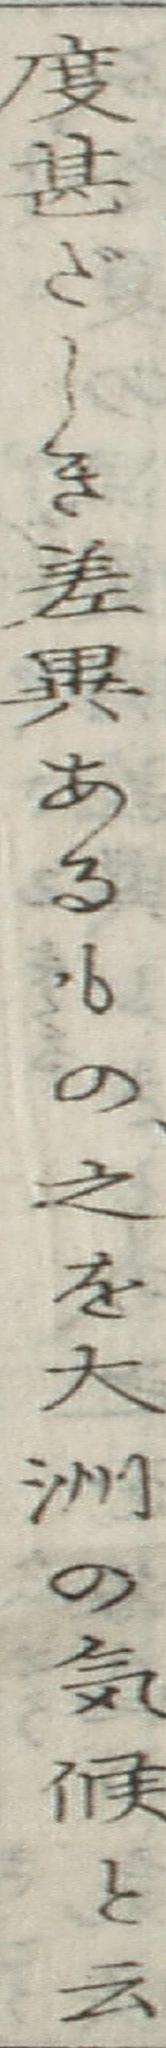度甚だしき差異あるもの、之を大洲の気候と云

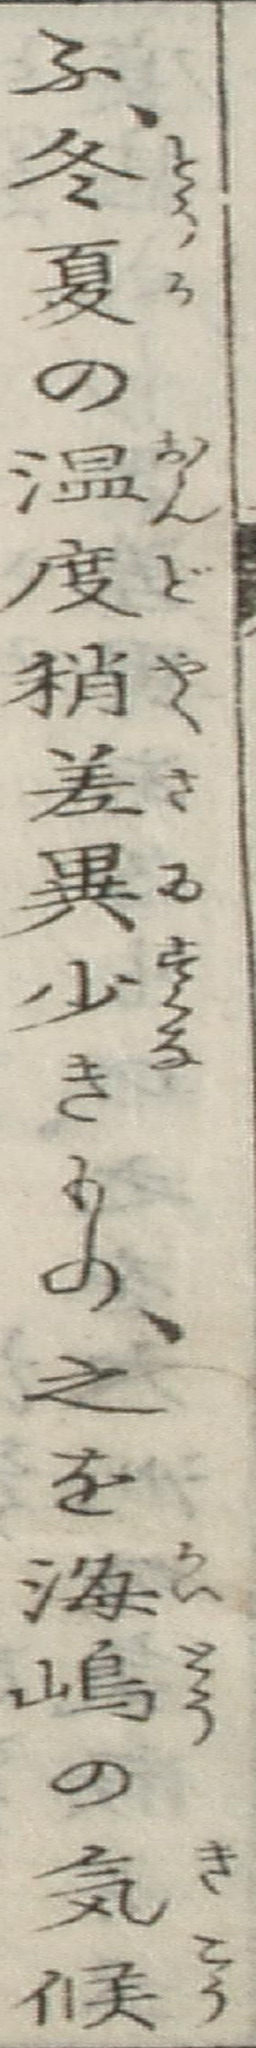ふ、冬夏の温度稍差異少きもの、之を海島の気候
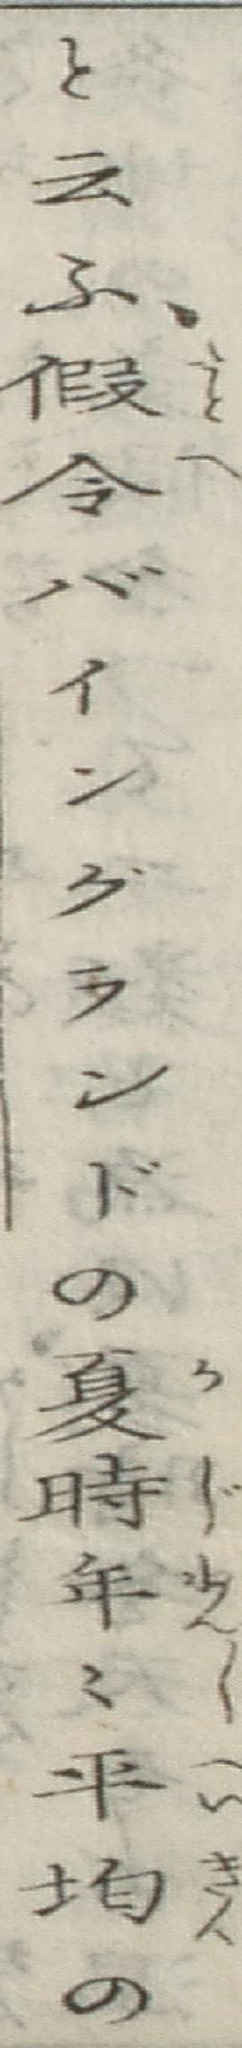と云ふ、仮令ばイングランドの夏時年ゝ平均の
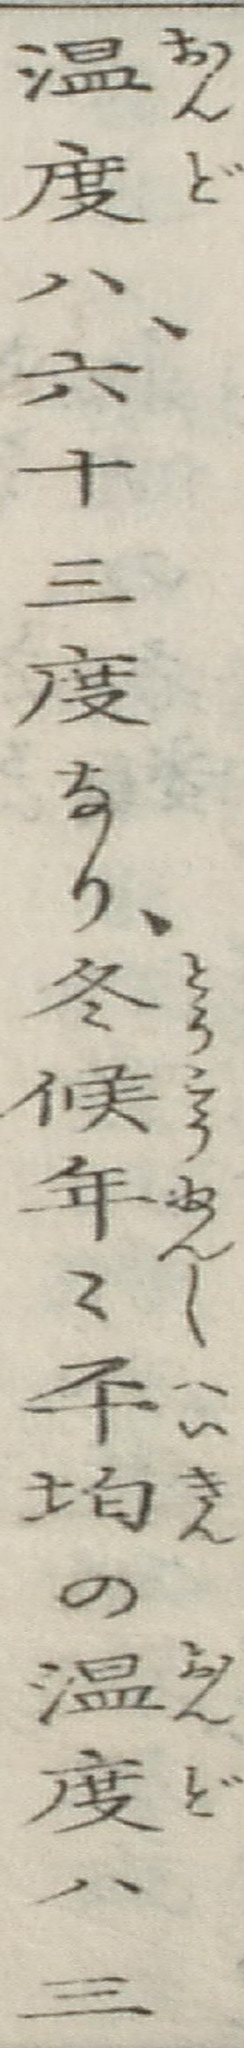温度は、六十三度なり、冬候年ゝ平均の温度は三
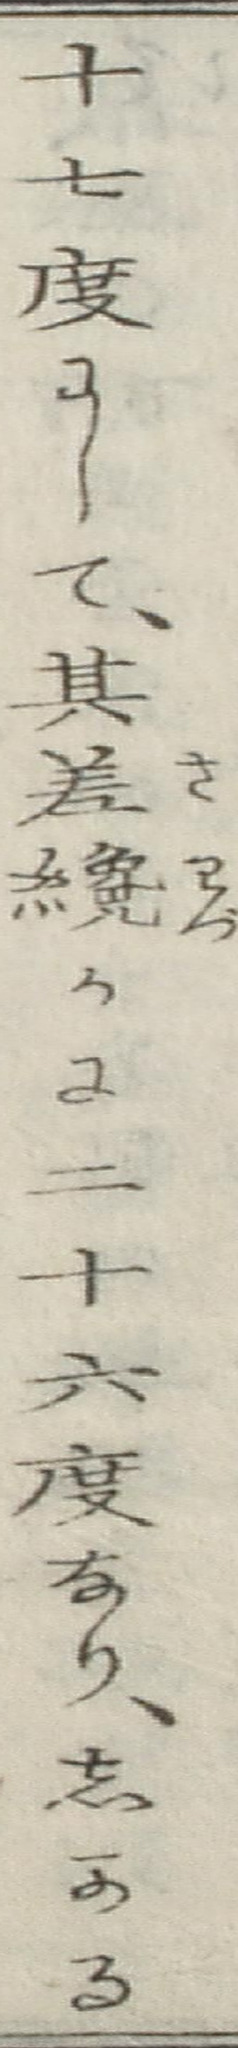十七度にして、其差纔かに二十六度なり、しかる
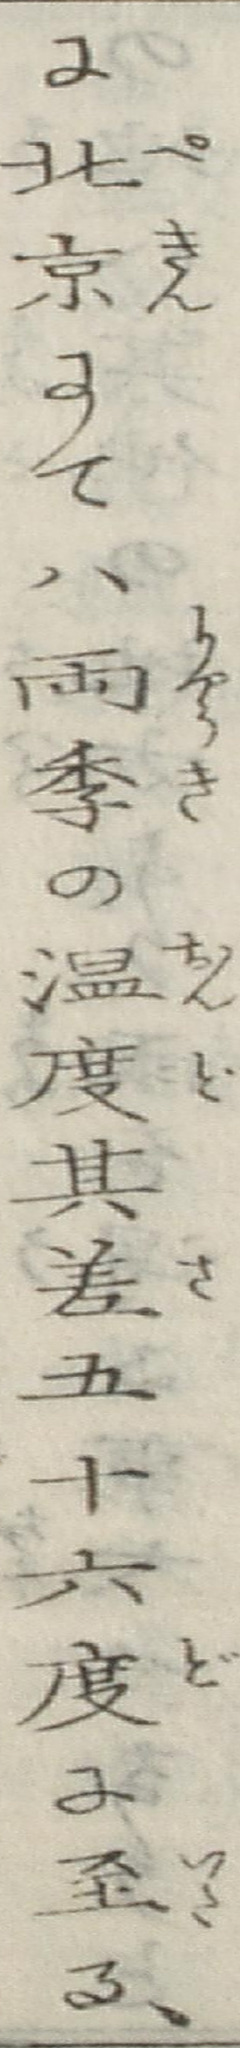に北京にては両季の温度其差五十六度に至る、
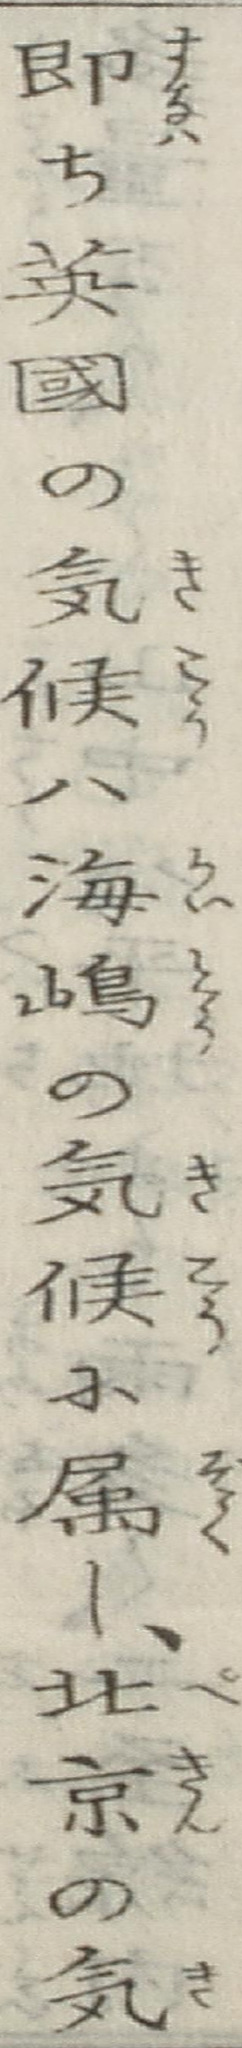即ち英国の気候は海島の気候に属し、北京の気
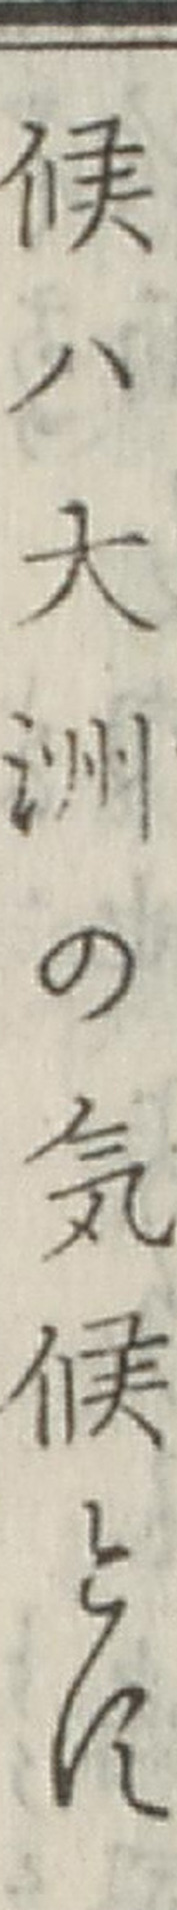候は大洲の気候とす
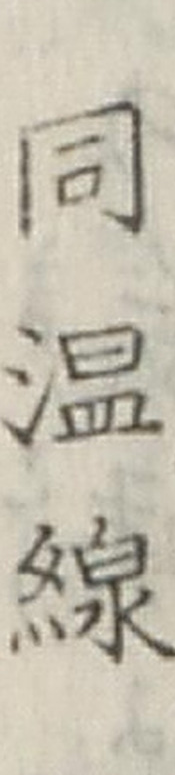同温線
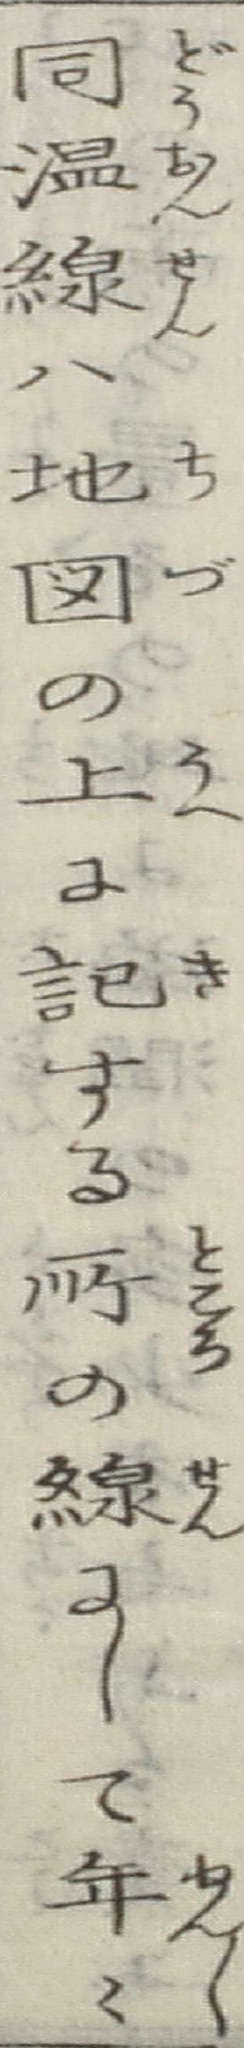同温線は地図の上に記する所の線にして年ゝ

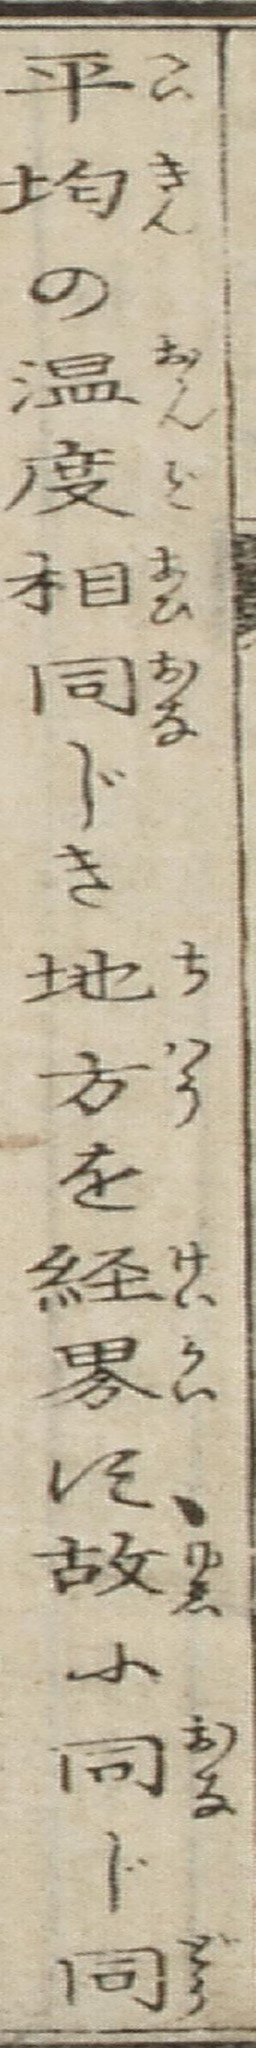平均の温度相同じき地方を経界す、故に同じ同
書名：訓蒙　天然地理學　下
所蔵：東京大学地震研究所図書室 Earthquake Research Institute Library, The University of Tokyo, JAPAN
